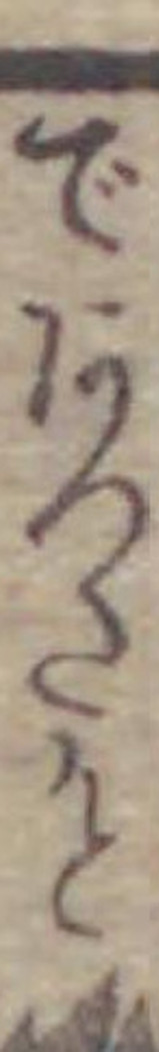であつたかと
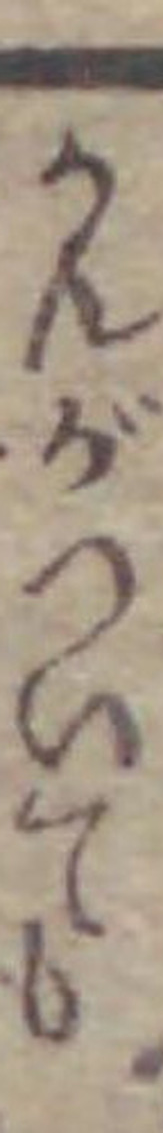かんがついても
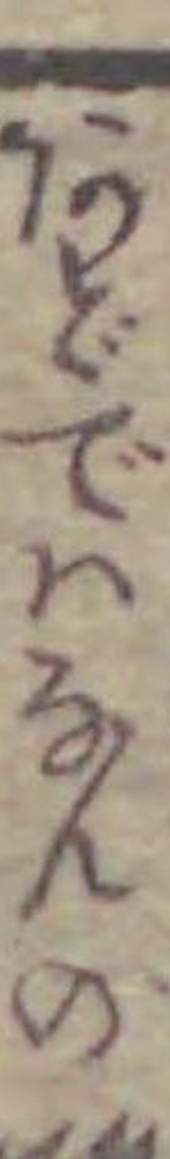あどではなんの
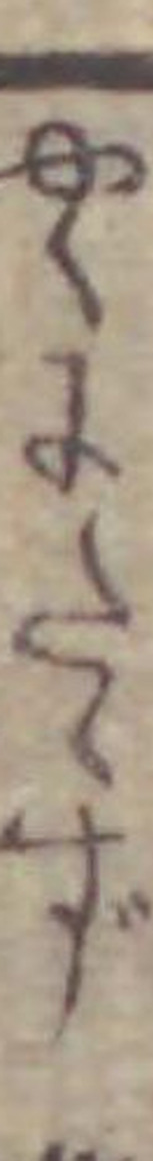やくにたゝず
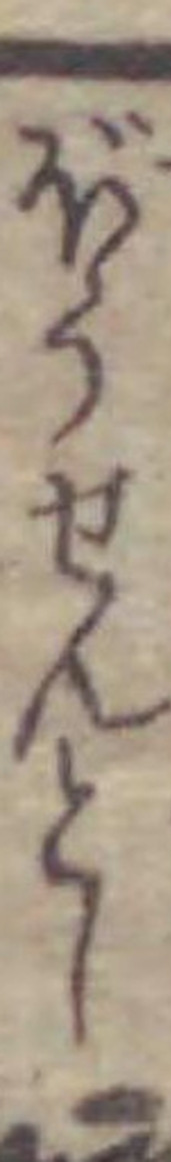ぼうせんとし
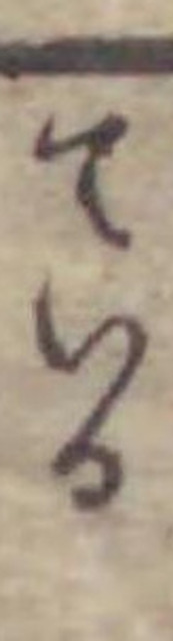ている
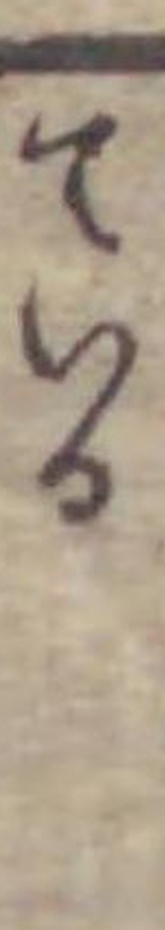ている
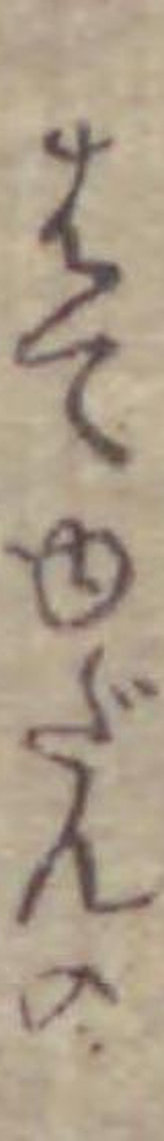はてゆだんの
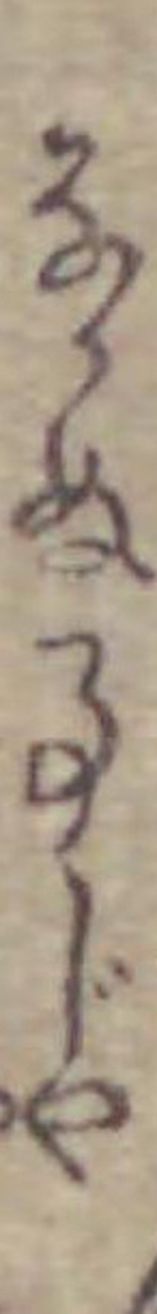ならぬ事じや
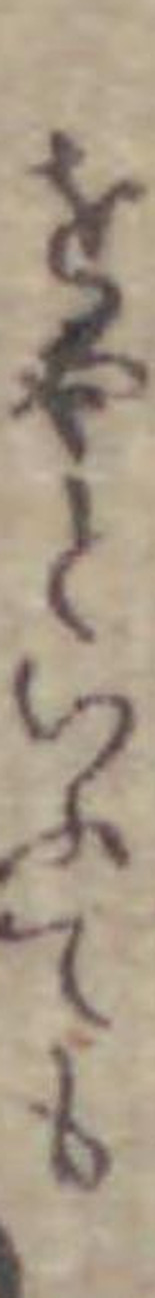をやといふても
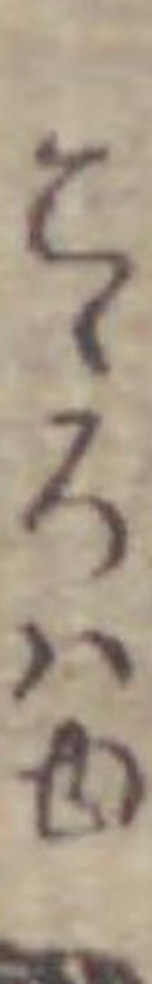こゝろはゆ
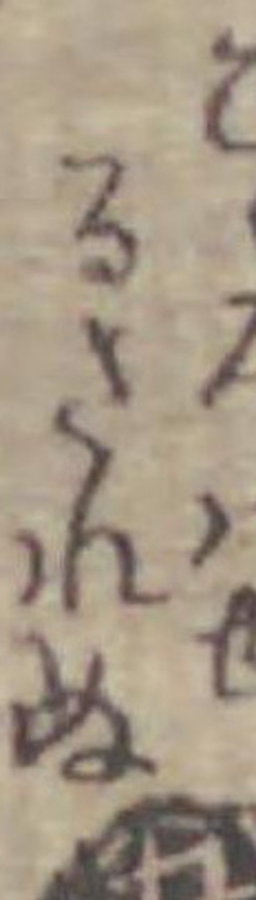るされぬ
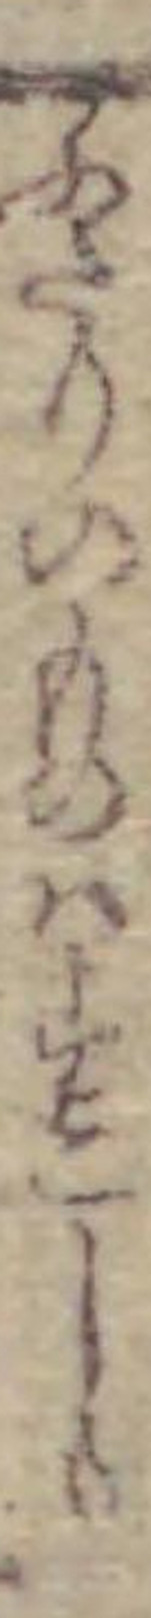ふたりのものはすこしも
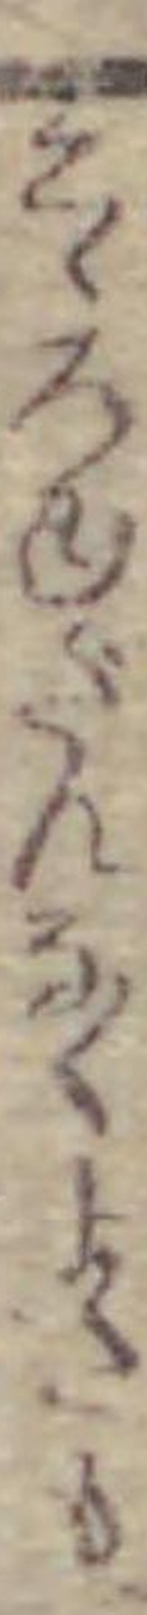こゝろゆだんなくまたも
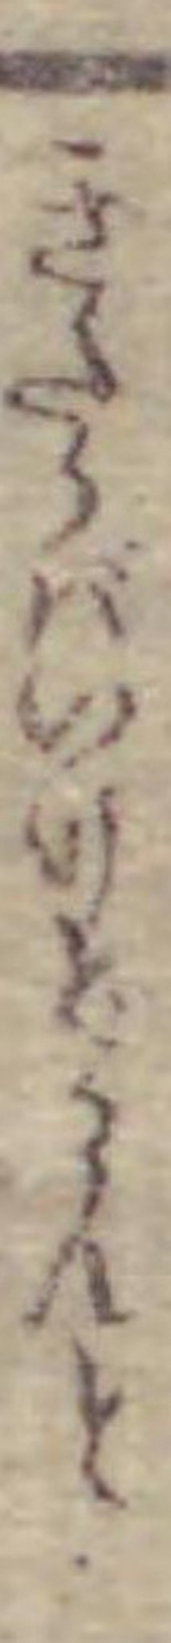きたらばいけどらんと
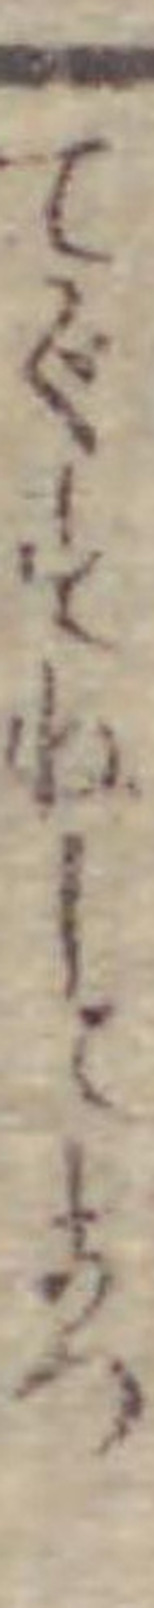てぐすねしてまつ
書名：二日替 : 2巻
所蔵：国立国会図書館 National Diet Library, JAPAN
